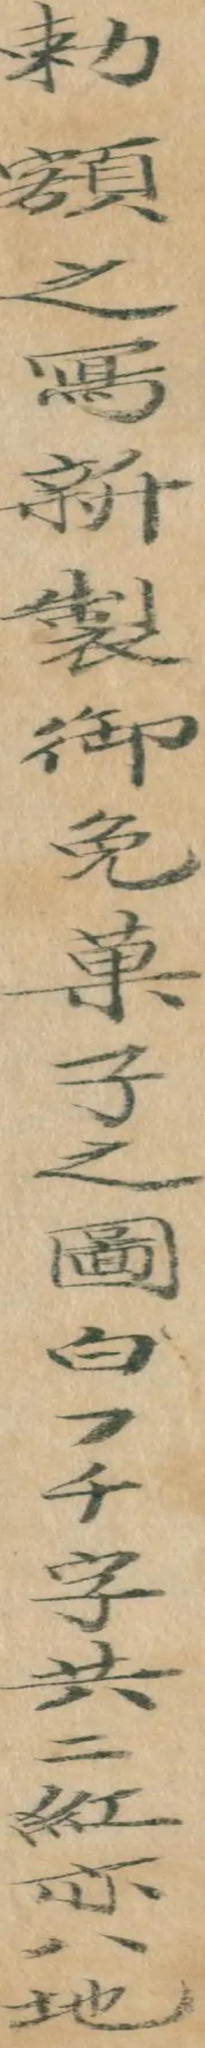勅額之寫新製御免菓子之圖白フチ字共ニ紅亦ハ地
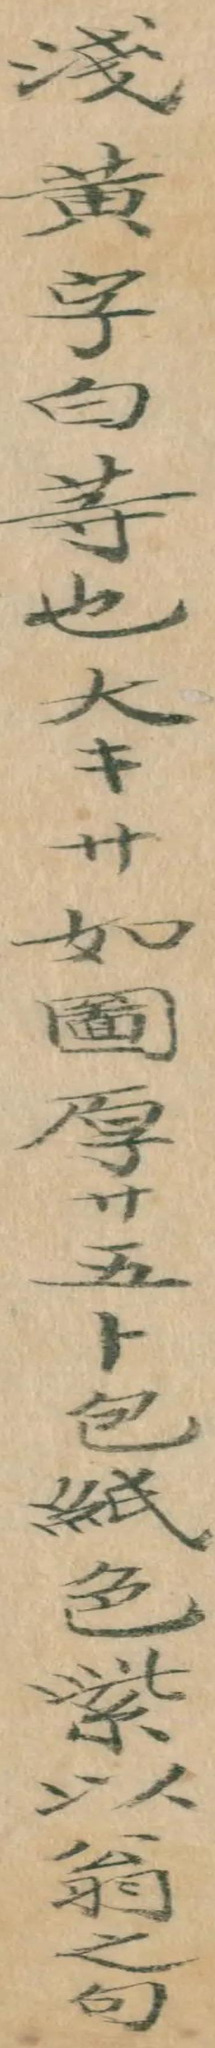浅黄字白等也大キサ如圖厚サ五ト包紙色紫以翁之句
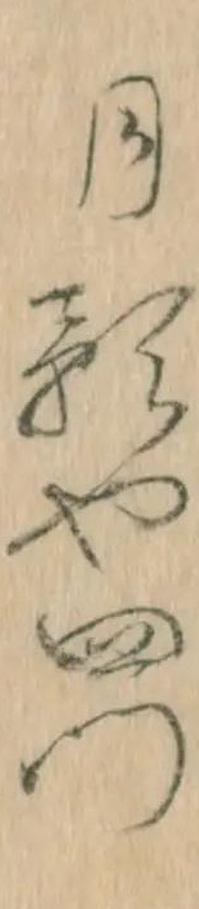月影や四門
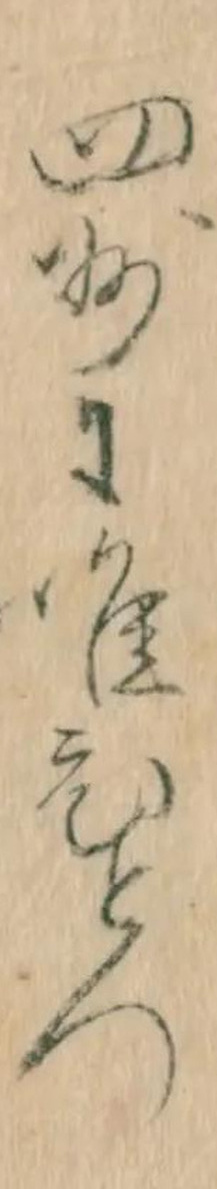四州に唯ひとつ
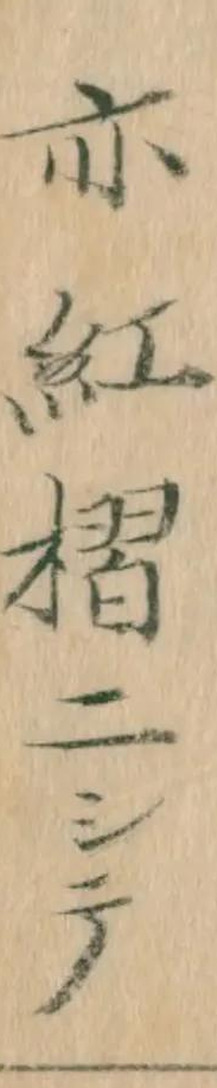亦紅摺ニシテ
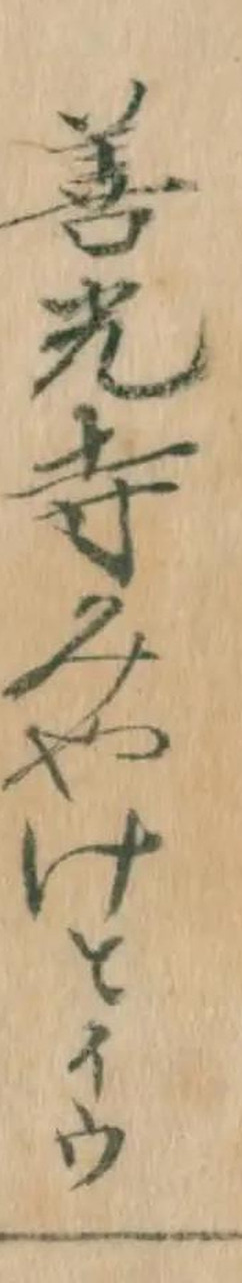善光寺みやけとイウ
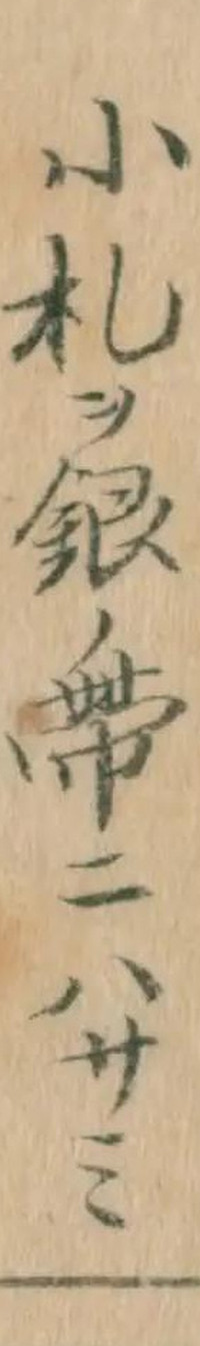小札ヲ銀ノ帯ニハサミ
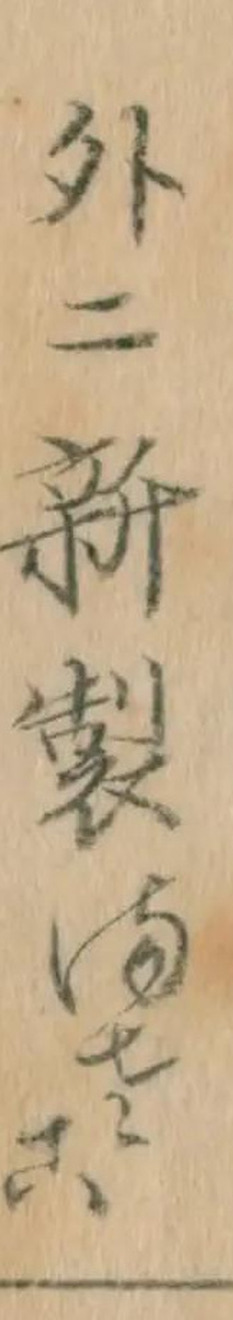外ニ新製まさこ
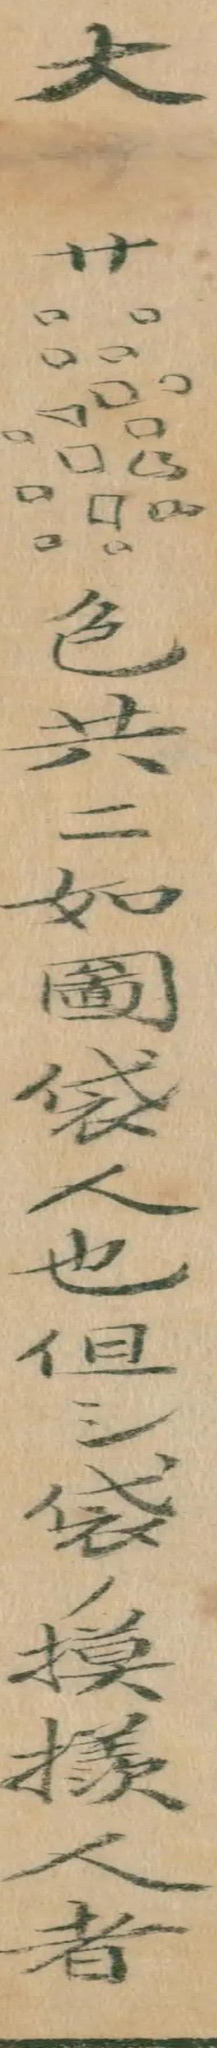大サ色共ニ如圖袋人也但シ袋ノ模様人者
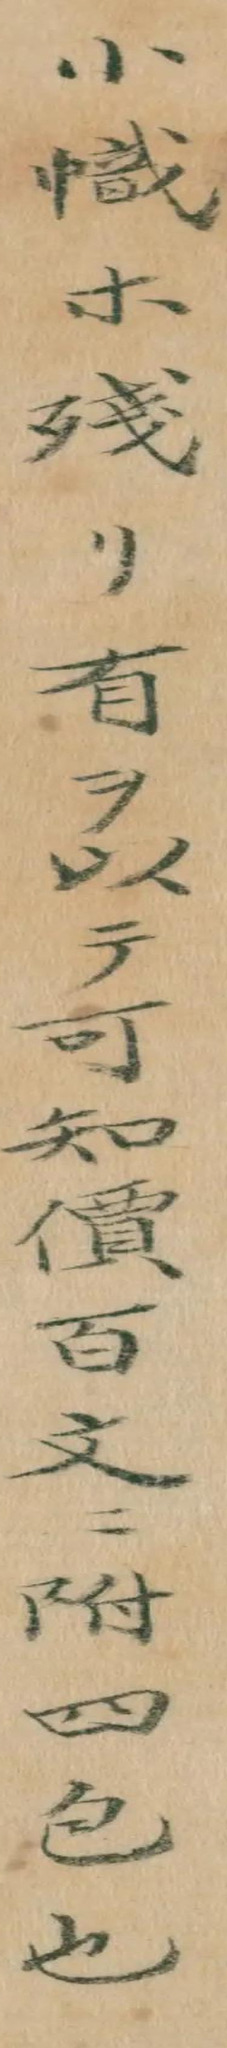小幟等残リ有ヲ以テ可知價百文ニ附四包也
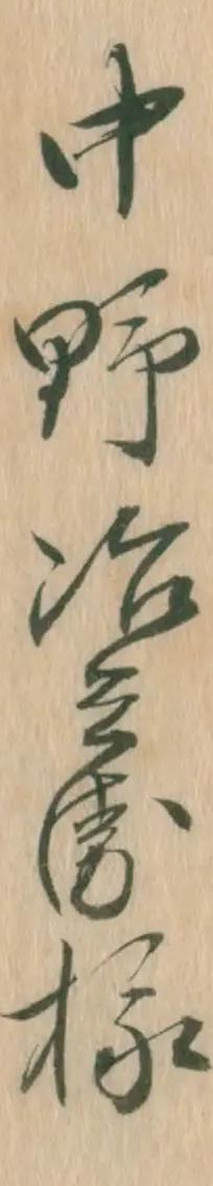中野治兵衛様
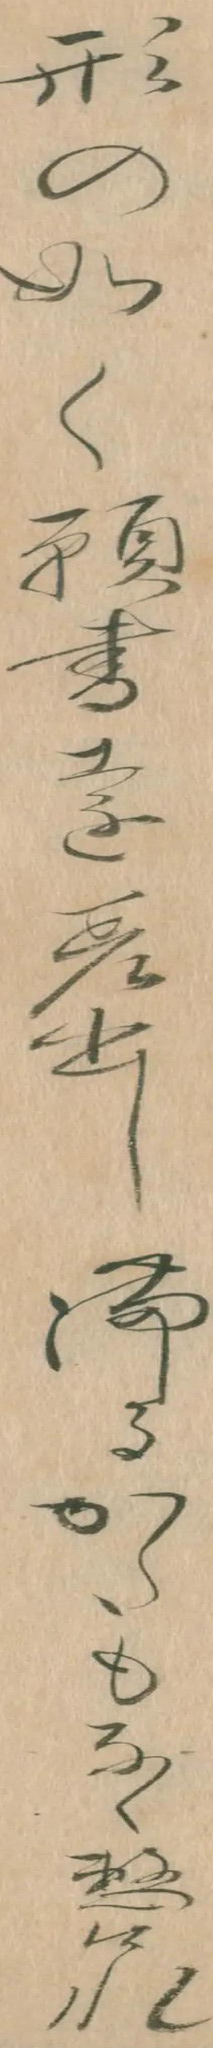形の如く願書を差出し滞るかたもなく整けれ
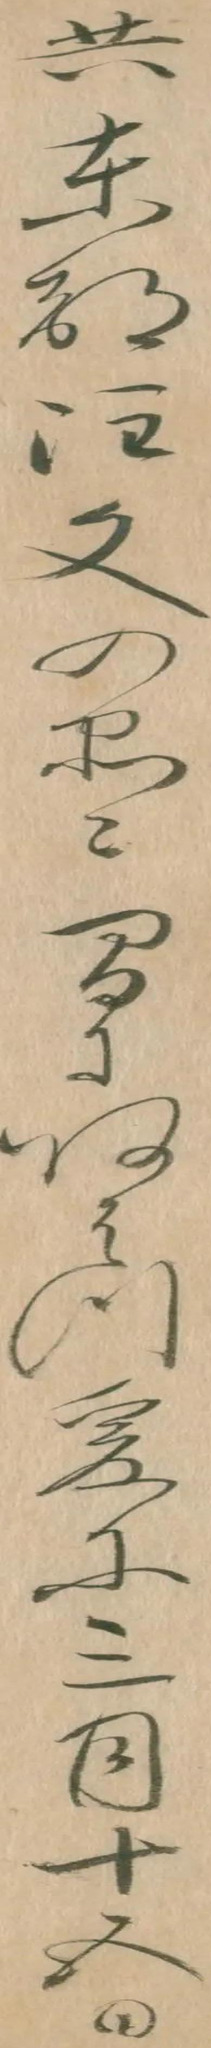共東都注文の品々間にあはつ爰に三月十五日
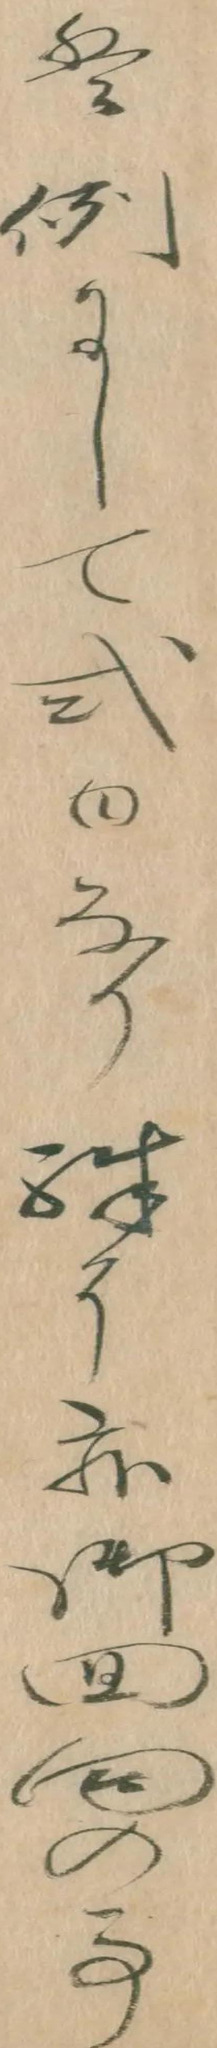は例にして式日なり誠に亦御回向の事
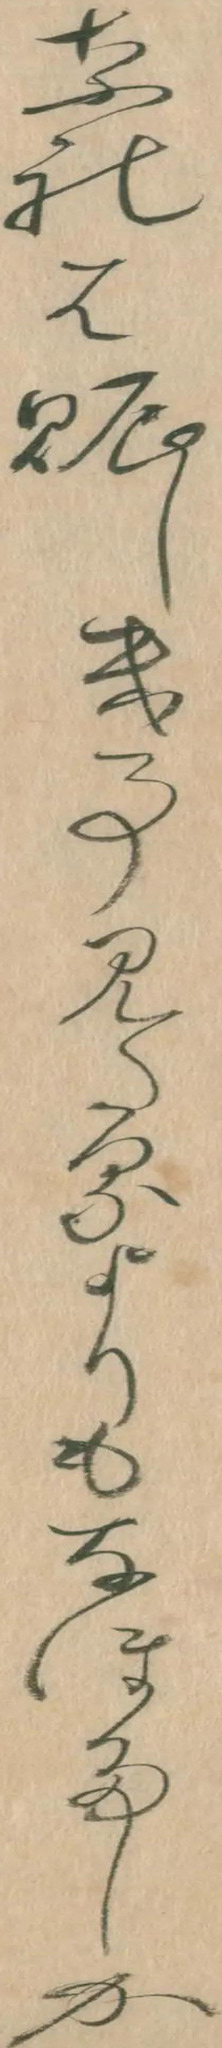なれは賑しき事見たるよりもなほたしか
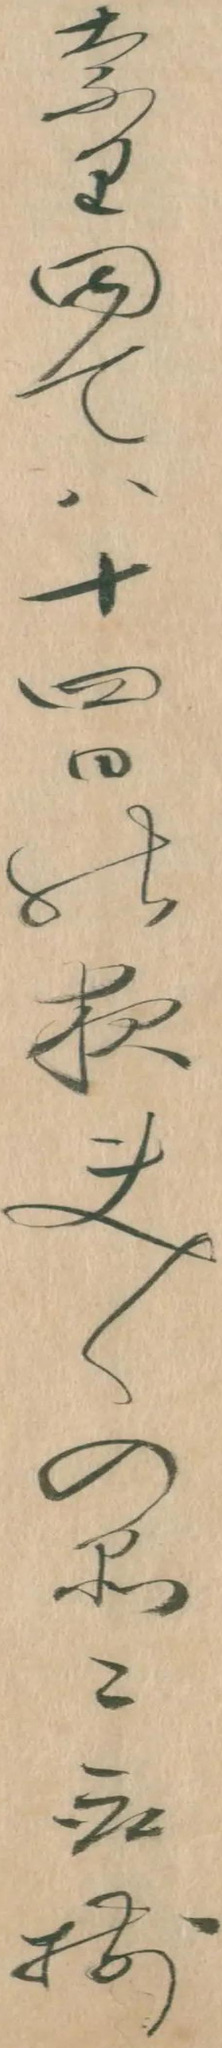なり因ては十四日の夜夫〳〵の品々取揃
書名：俗語之種. [2]
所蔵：国立国会図書館 National Diet Library, JAPAN
